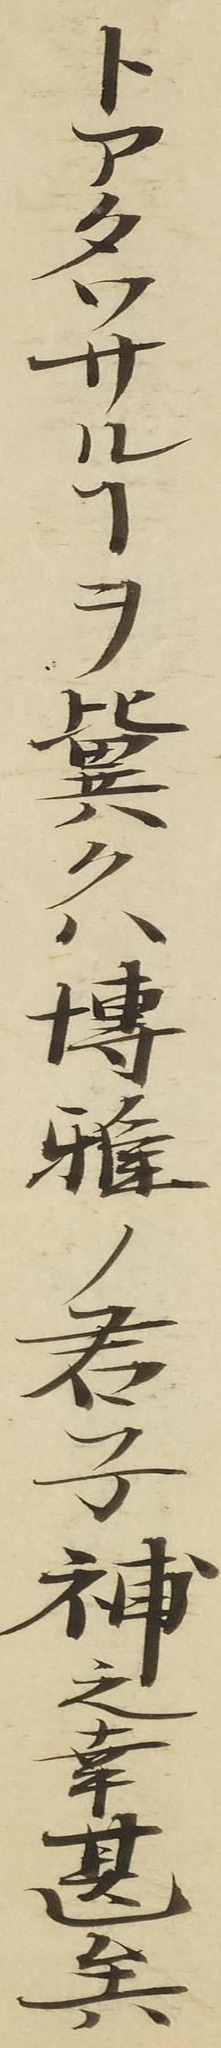トアタワサルコトヲ冀クハ博雅ノ君子補之幸甚矣
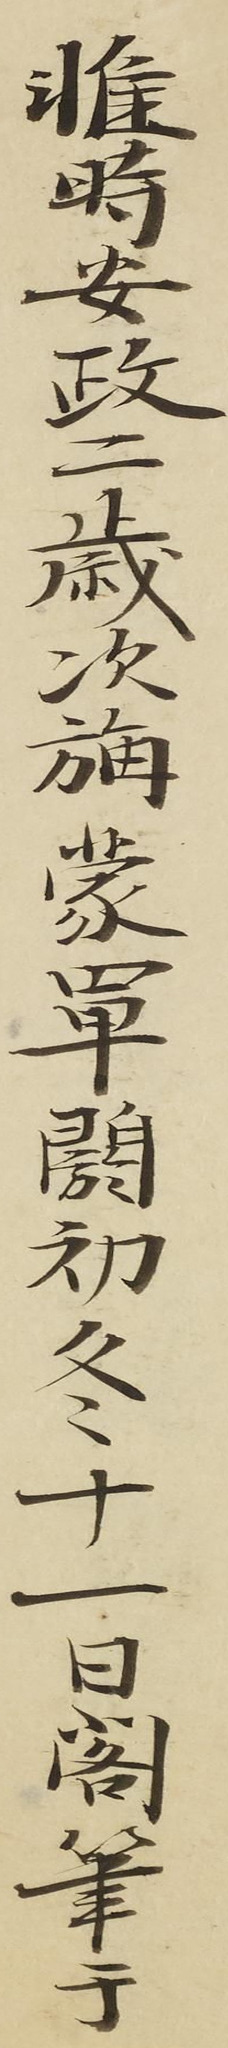惟時安政ニ歳次旃蒙単閼初冬十一日閣筆于
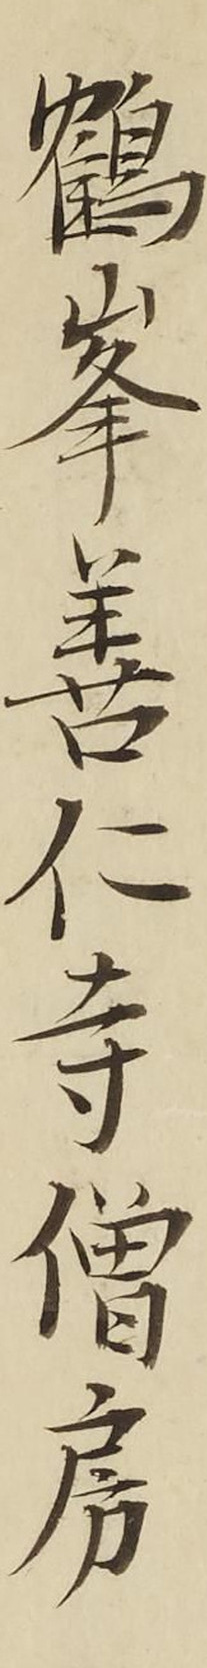鶴峯善仁寺僧房
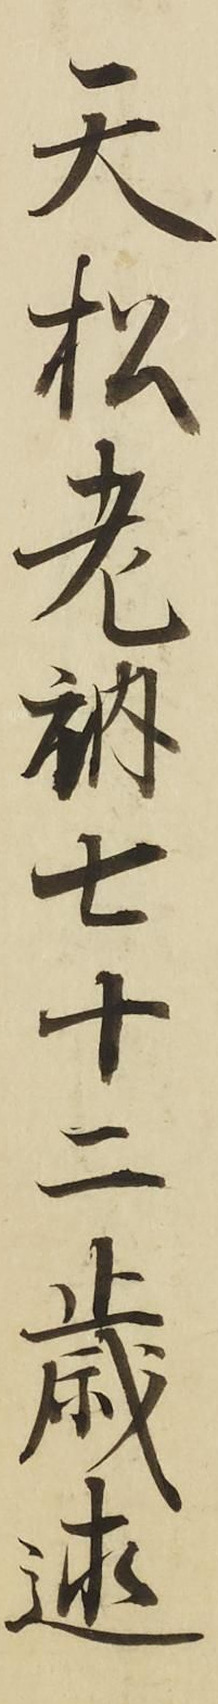天松老衲七十二歳述
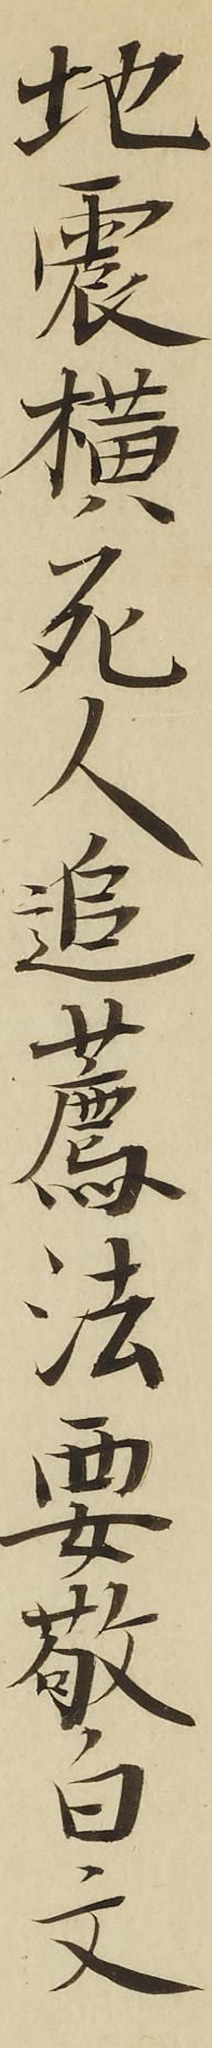地震横死人追薦法要敬白文
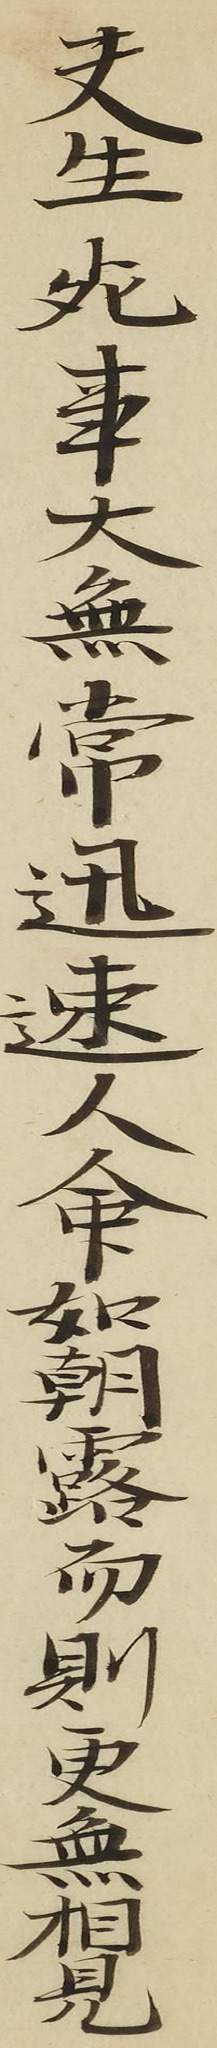夫生死事大無常迅速人命如朝露而則更無相見
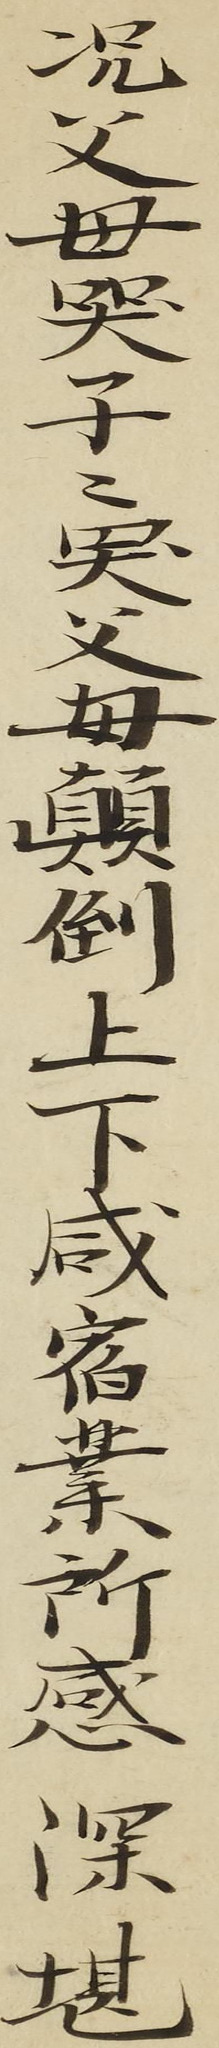況父母哭子々哭父母顛倒上下咸宿業所感深堪
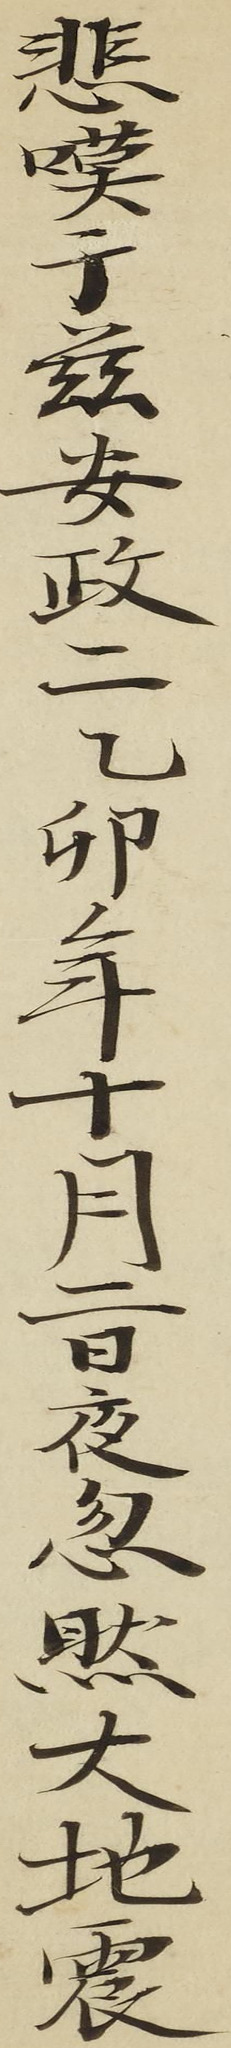悲嘆于茲安政ニ乙卯年十月二日夜忽然大地震
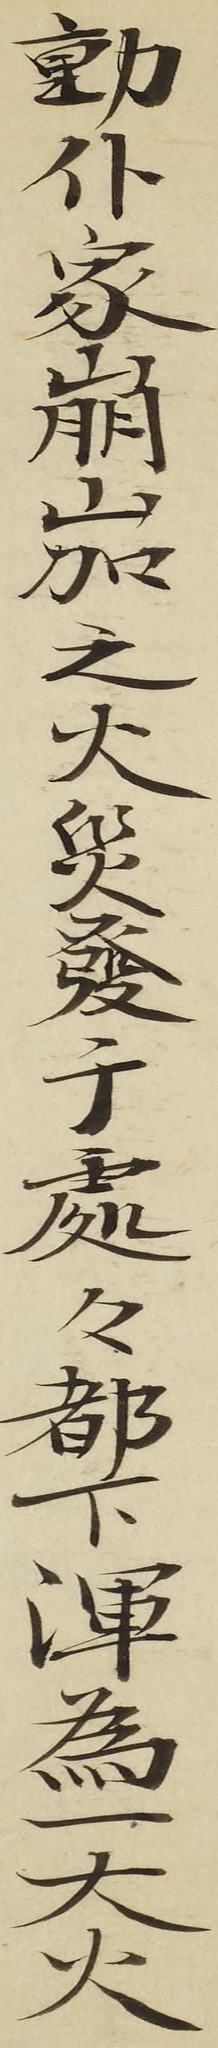動仆家崩山加之火災発于処々都下渾為一大火
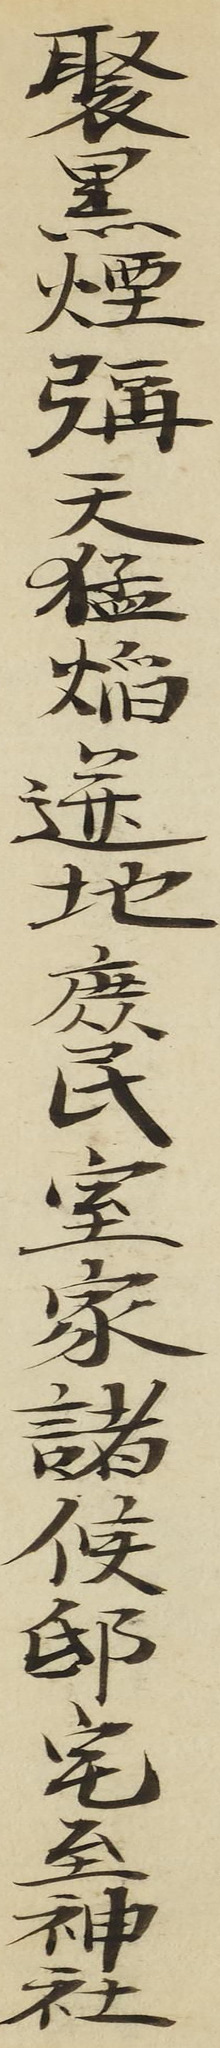聚黒煙弥天猛焔迸地庶民室家諸侯邸宅至神社
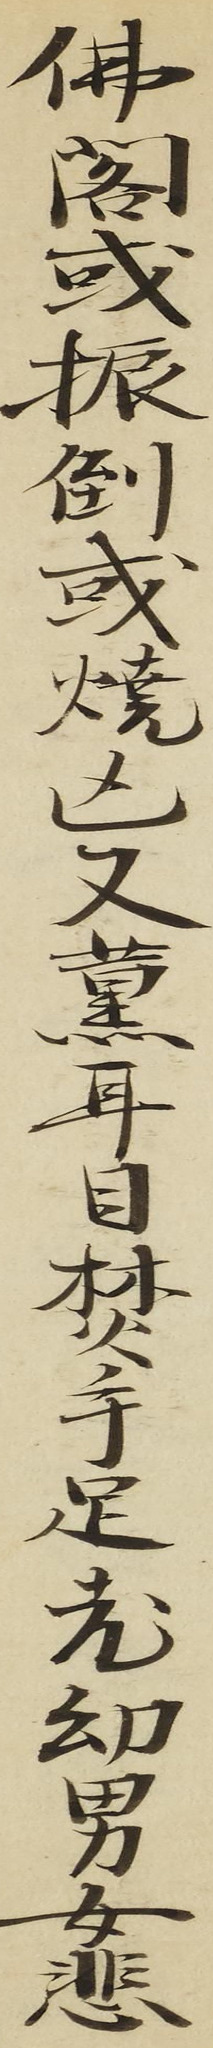仏閣或振倒或焼亡又薫耳目焚手足老幼男女悲
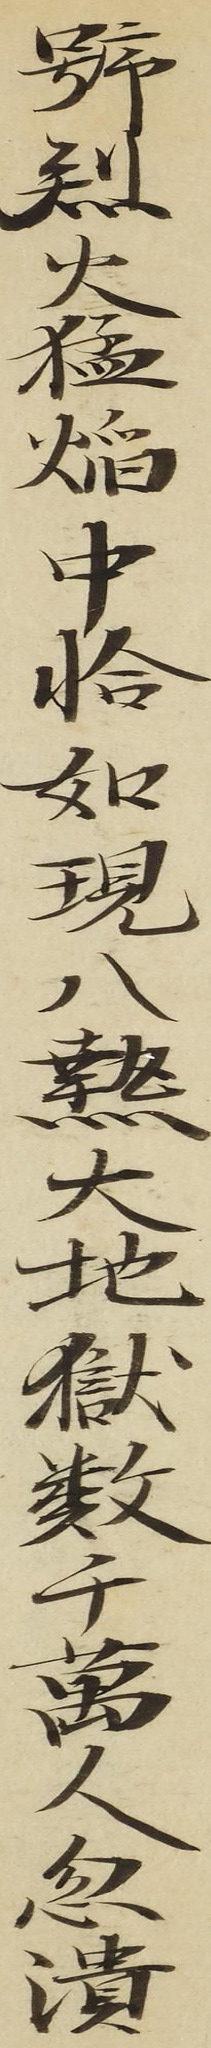号烈火猛焔中恰如現八熱大地獄数千万人忽潰
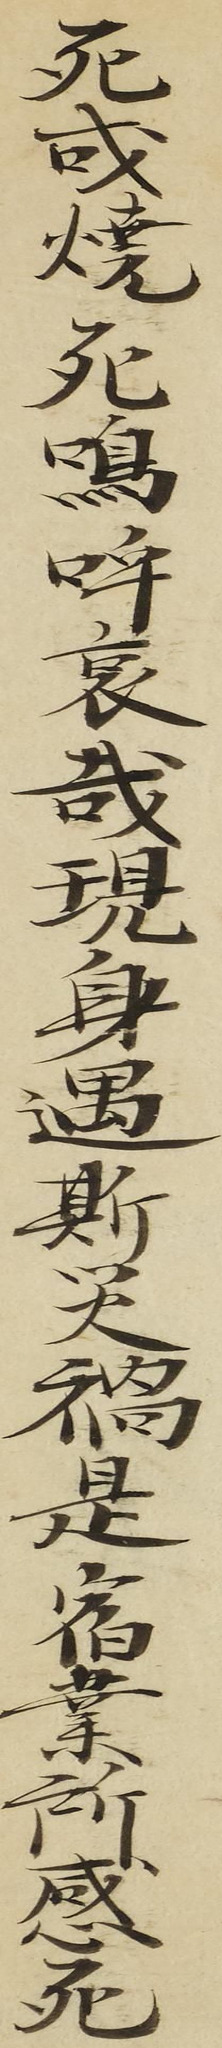死或焼死嗚呼哀哉現身遇斯災禍是宿業所感死
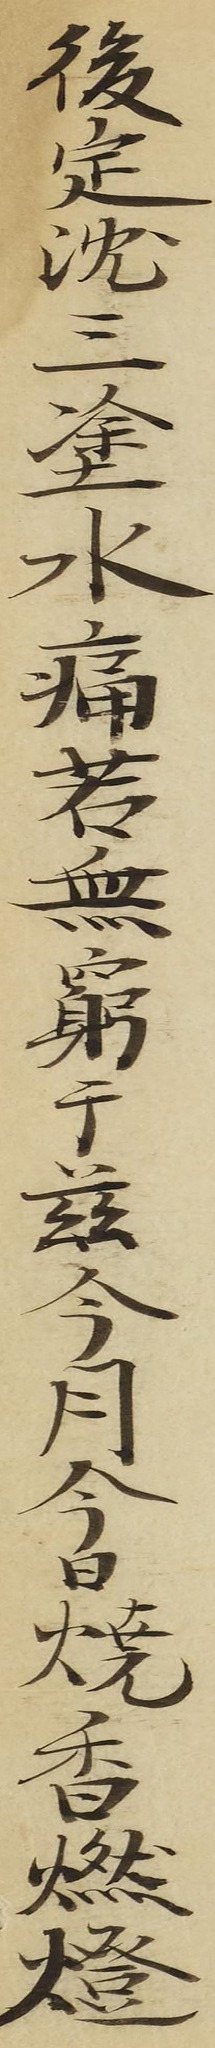後定沈三塗水痛苦無窮于茲今月今日焼香燃燈

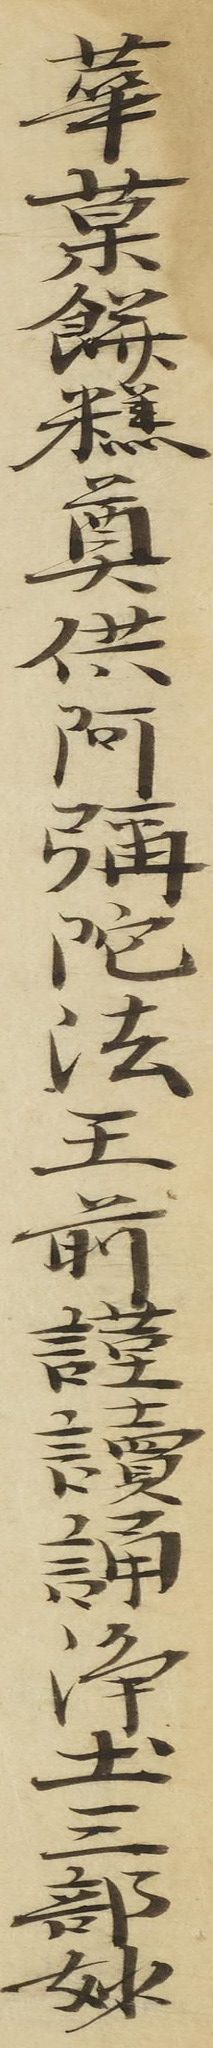華菓餅糕奠供阿弥陀法王前謹読誦浄土三部妙
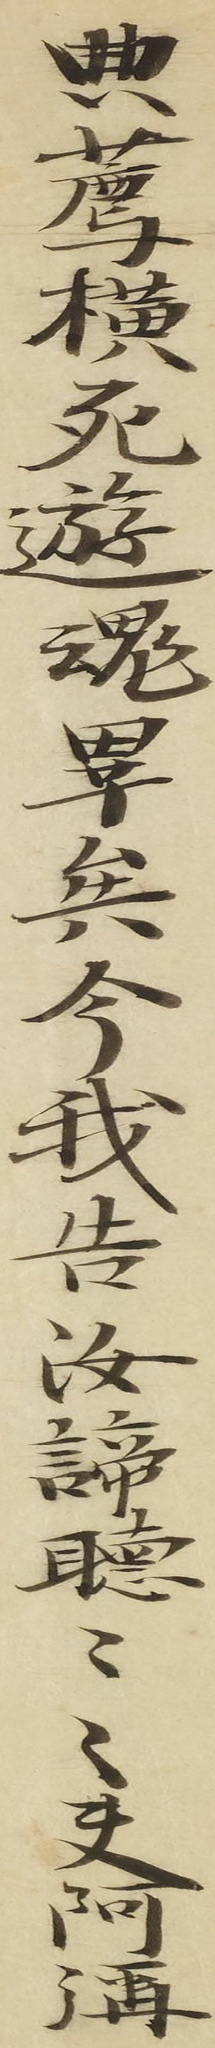典薦横死遊魂畢矣今我告汝諦聴々々夫阿弥
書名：地震説　鶴高山善仁寺天柗老人著述　全
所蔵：東京大学地震研究所図書室 Earthquake Research Institute Library, The University of Tokyo, JAPAN
